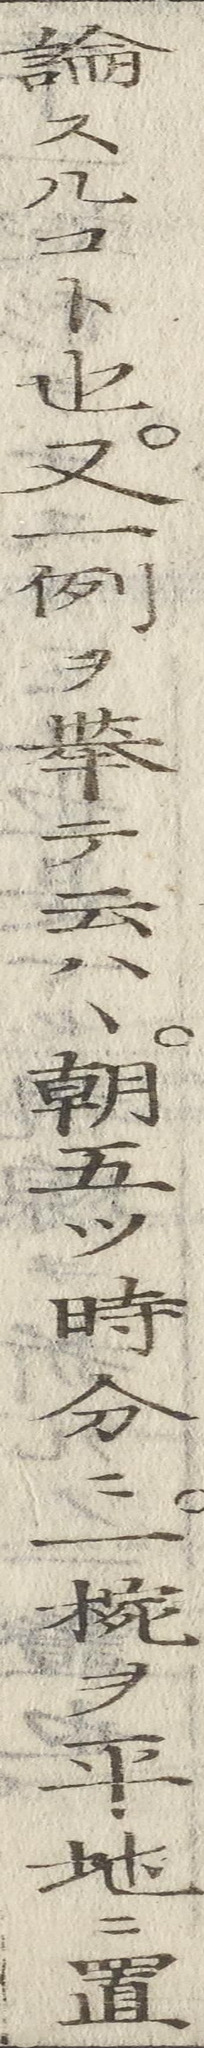論スルコト也。又一例ヲ挙テ云ハヽ。朝五ツ時分ニ。一椀ヲ平地ニ置
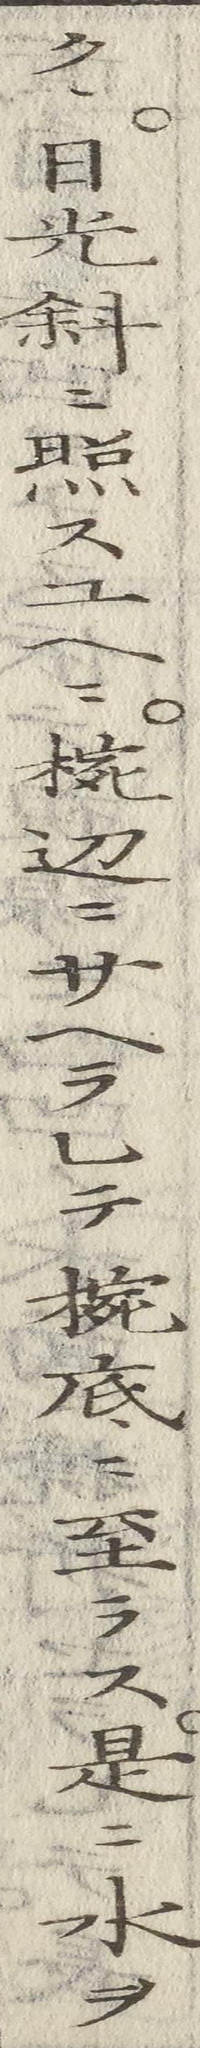ク。日光斜ニ照スユヘニ。椀辺ニサヘラレテ椀底ニ至ラス。是ニ水ヲ
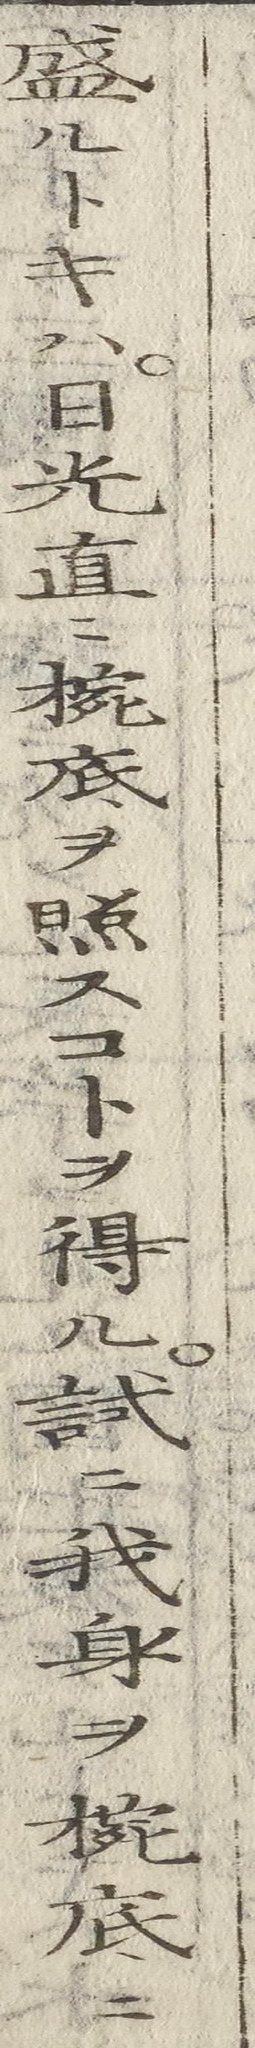盛ルトキハ。日光直ニ椀底ヲ照スコトヲ得ル。試ニ我身ヲ椀底ニ
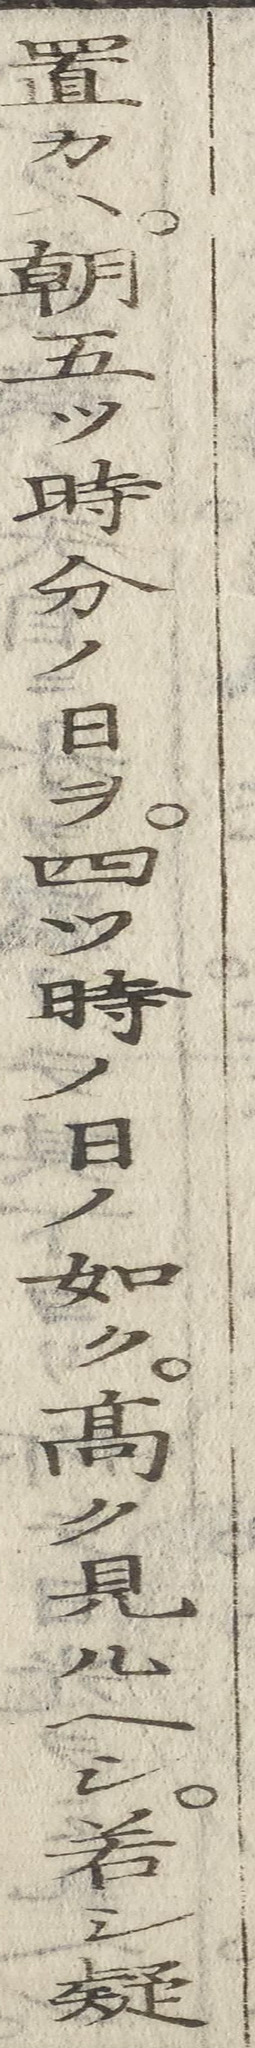置カハ。朝五ツ時分ノ日ヲ。四ツ時ノ日ノ如ク。高ク見ルヘシ。若シ疑

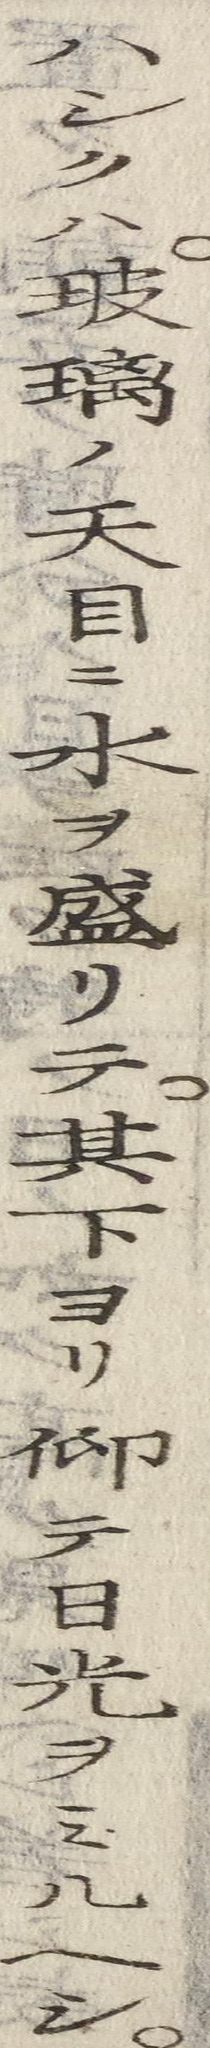ハシクハ。玻璃ノ天目ニ水ヲ盛リテ。其下ヨリ仰テ日光ヲミルヘシ。
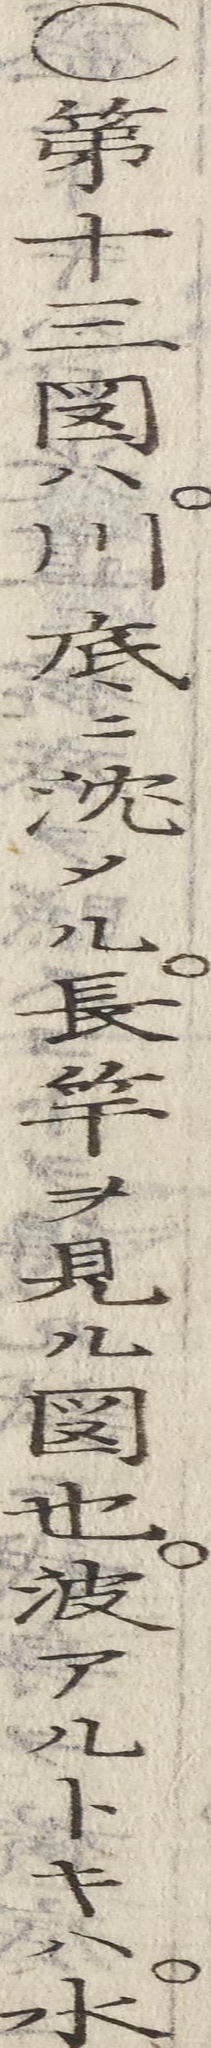○第十三図ハ。川底ニ沈メル。長竿ヲ見ル図也。波アルトキハ。水
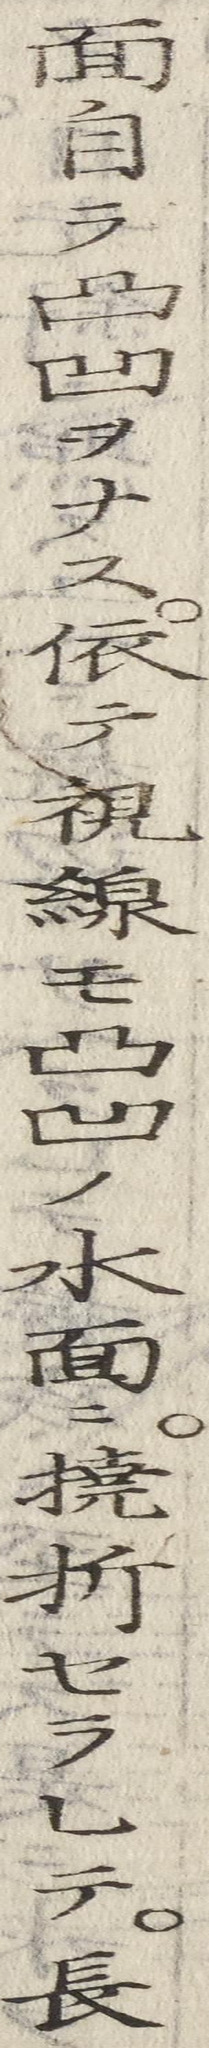面自ラ凸凹ヲナス。依テ視線モ凸凹ノ水面ニ。撓折セラレテ。長
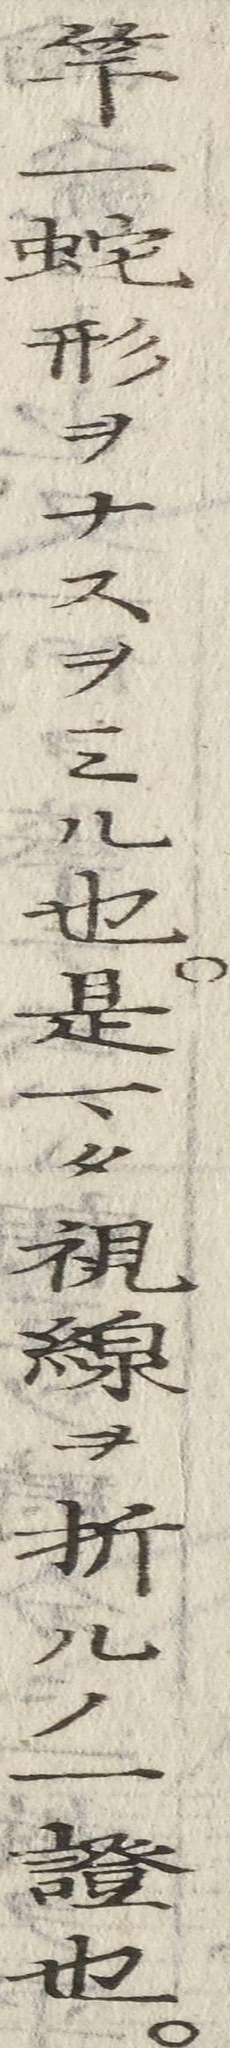竿一蛇形ヲナスヲミル也。是マタ視線ヲ折ルノ一証也。
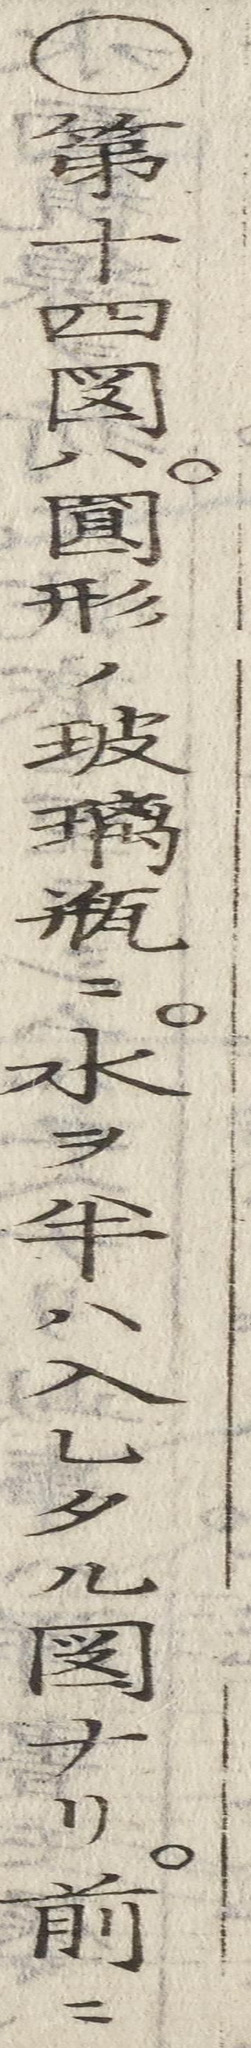○第十四図ハ。円形ノ玻璃瓶ニ。水ヲ半ハ入レタル図ナリ。前ニ
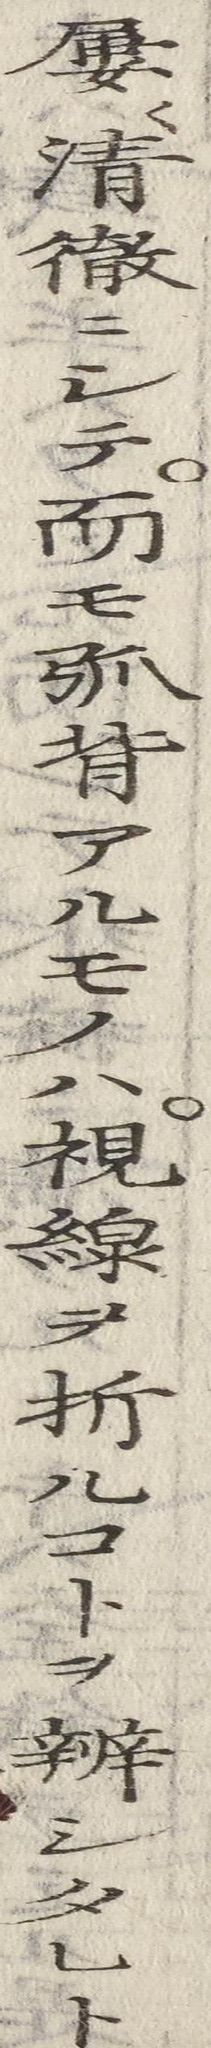屡〳〵清徹ニシテ。而モ弧背アルモノハ。視線ヲ折ルコトヲ弁シタレト
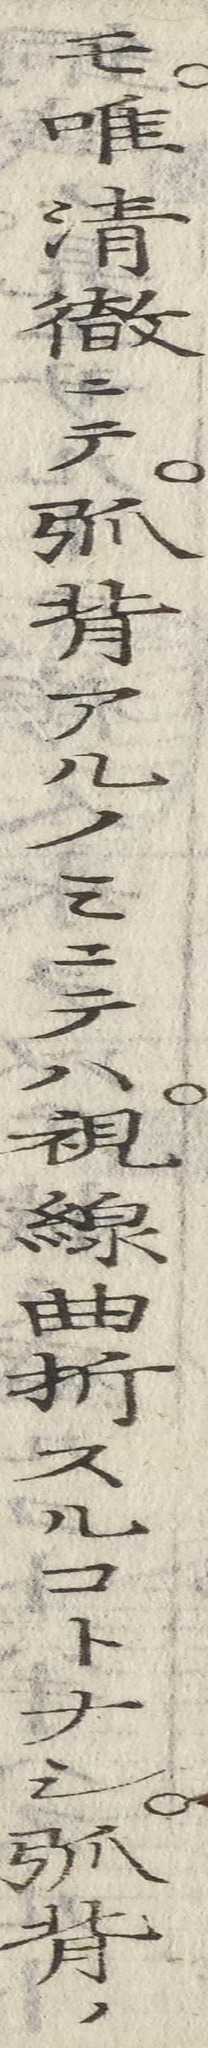モ。唯清徹ニテ。弧背アルノミニテハ。視線曲折スルコトナシ。弧背ノ
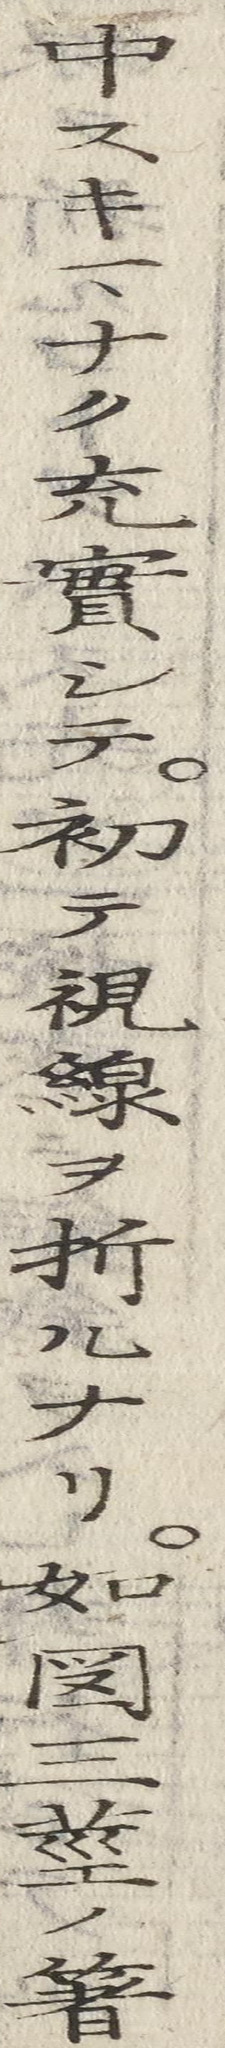中スキマナク充実シテ。初テ視線ヲ折ルナリ。如図三莖ノ箸
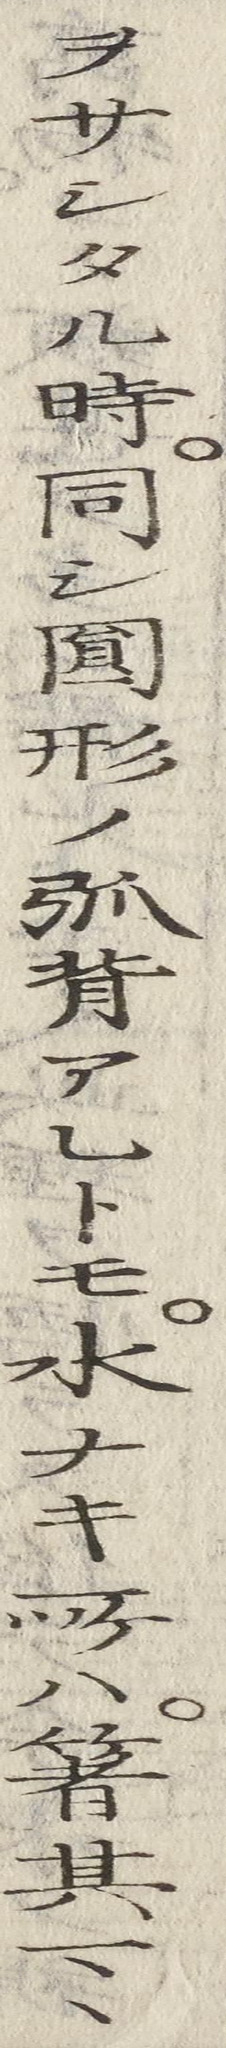ヲサシタル時。同シ円形ノ弧背アレトモ。水ナキ所ハ。箸其マヽ
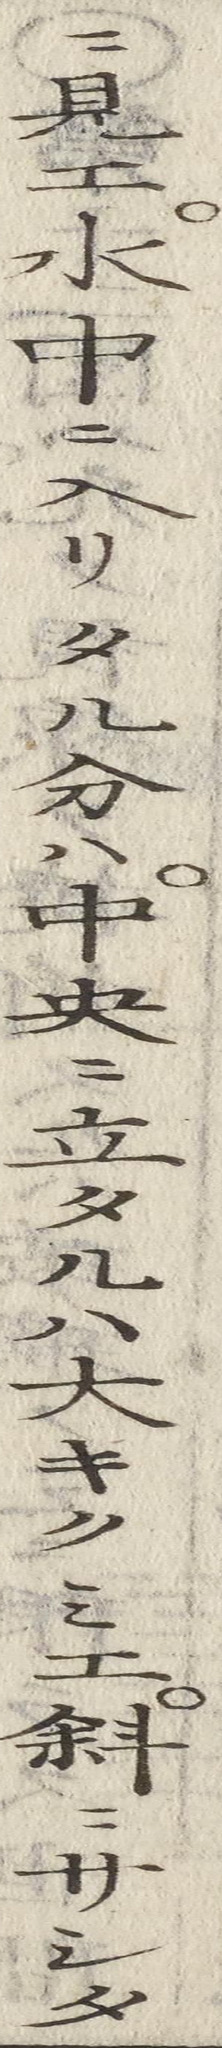ニ見エ。水中ニ入リタル分ハ。中央ニ立タルハ大キクミエ。斜ニサシタ
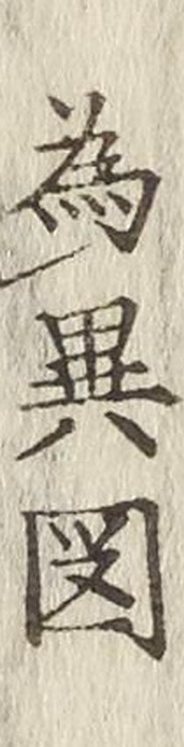為異図
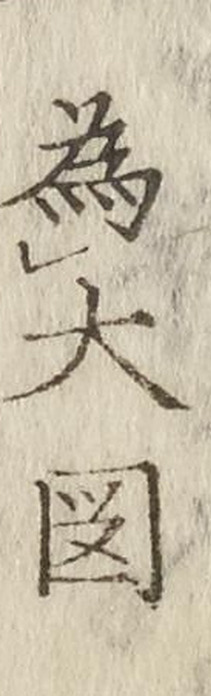為大図
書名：護法新論　上
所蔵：東京大学地震研究所図書室 Earthquake Research Institute Library, The University of Tokyo, JAPAN
